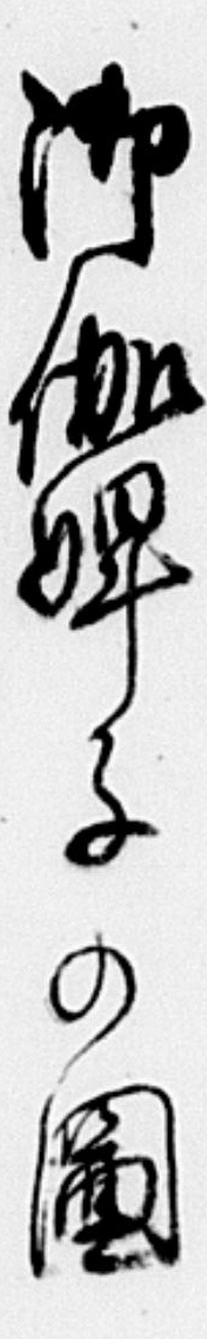御伽婢子の図
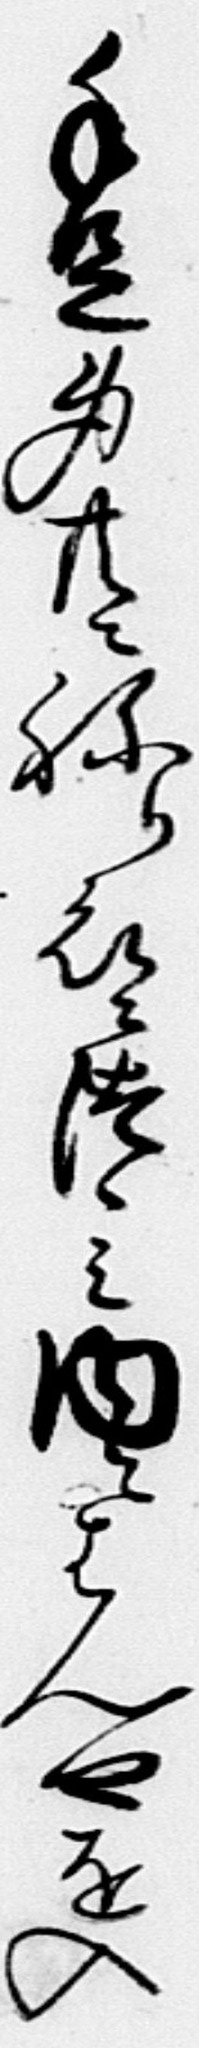手足身共にねり衣につゝみ内にはんやを入
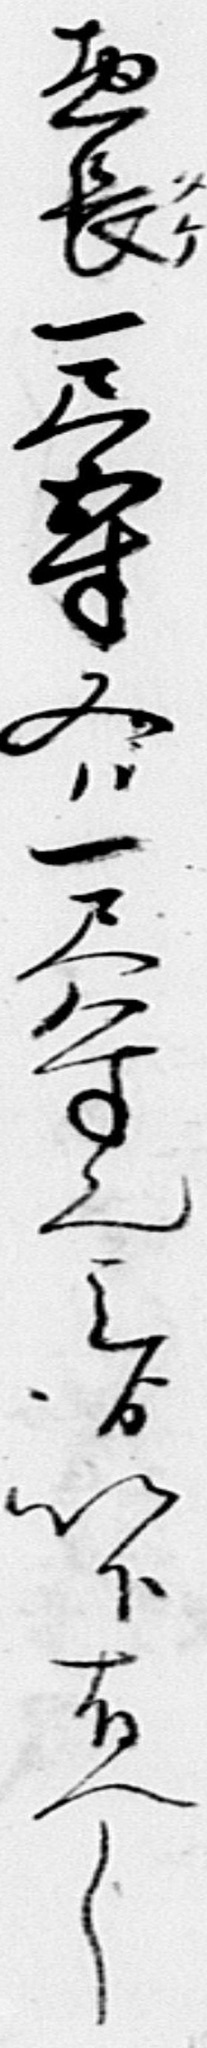惣長一尺五寸又は一尺八寸也是より以下有へし
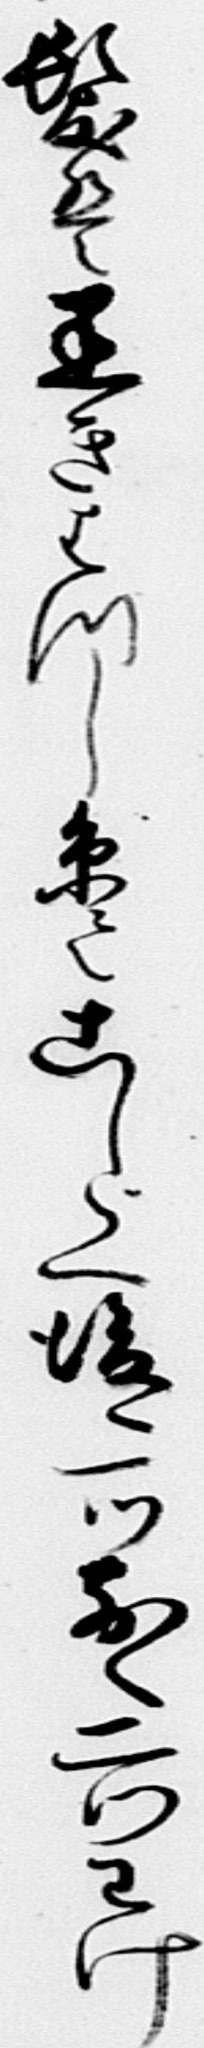髪はわきはつし糸にてこしらへ後へ一つ前へ二つわけ
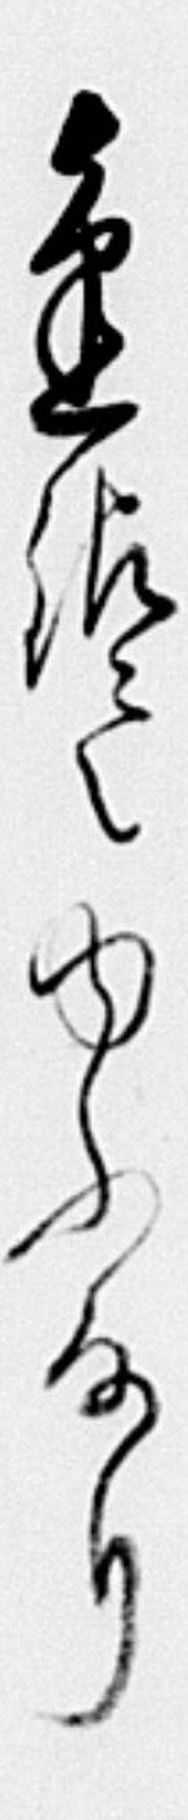金銀にてゆふなり
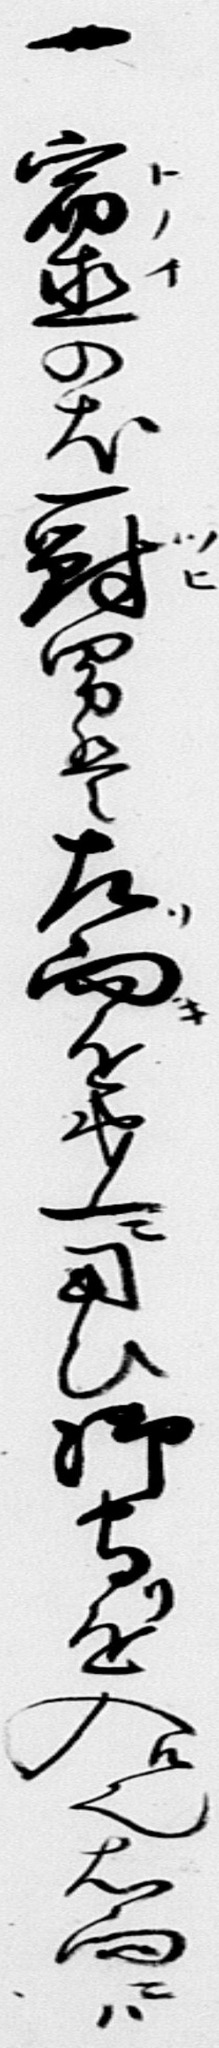一宿直の犬一対男は左り向きを第一に用ひ御守りを入る也右向には
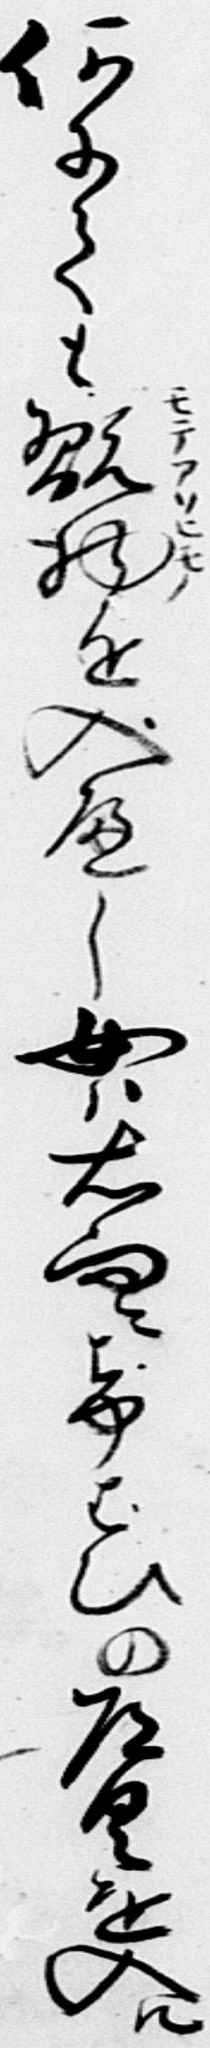何にても翫物を入へし女は右向にけはひの道具を入る
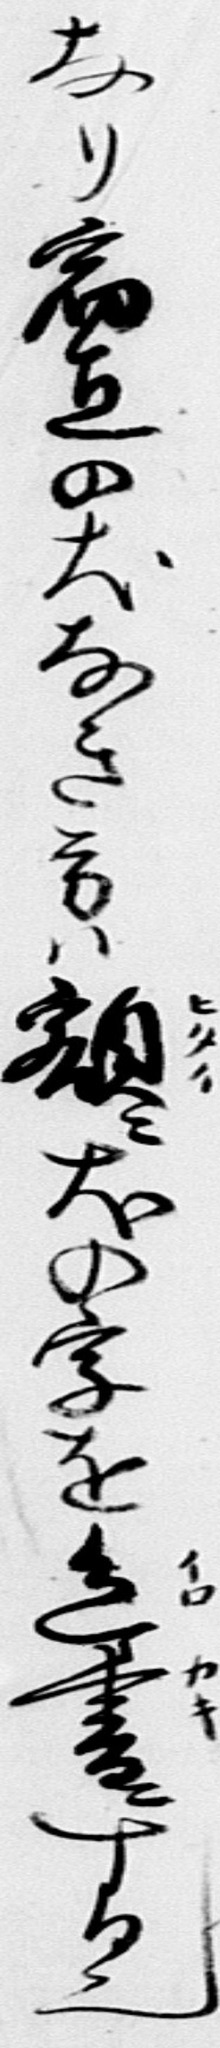なり宿直の犬なき方は額に犬の字を色書する也

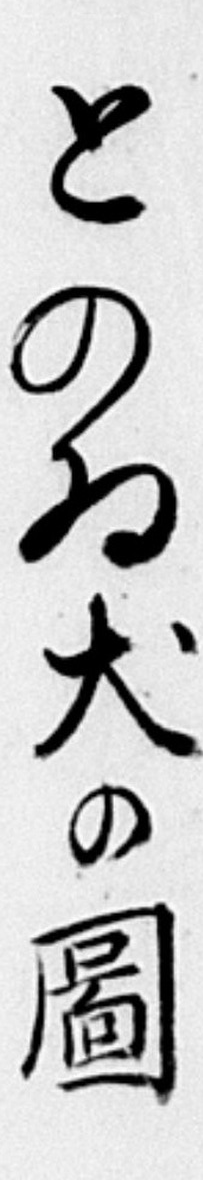とのゐ犬の図
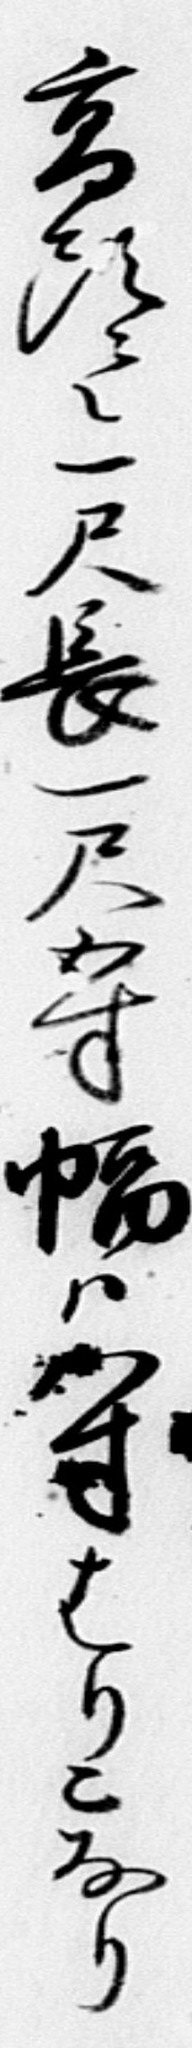高頭にて一尺長一尺五寸幅は五寸はりこなり
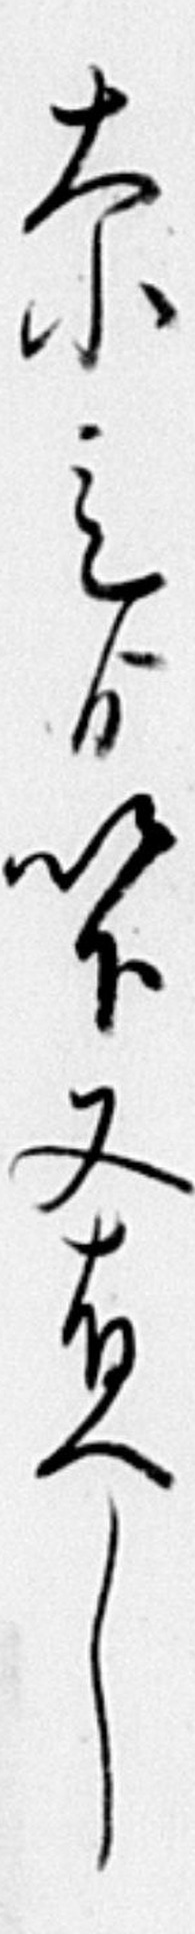大小是ゟ以下又有へし
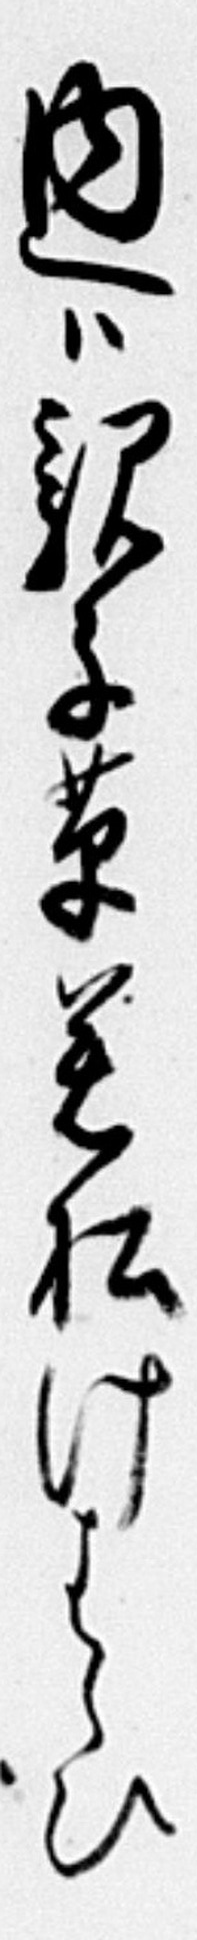内へは親子草若松けはらひ
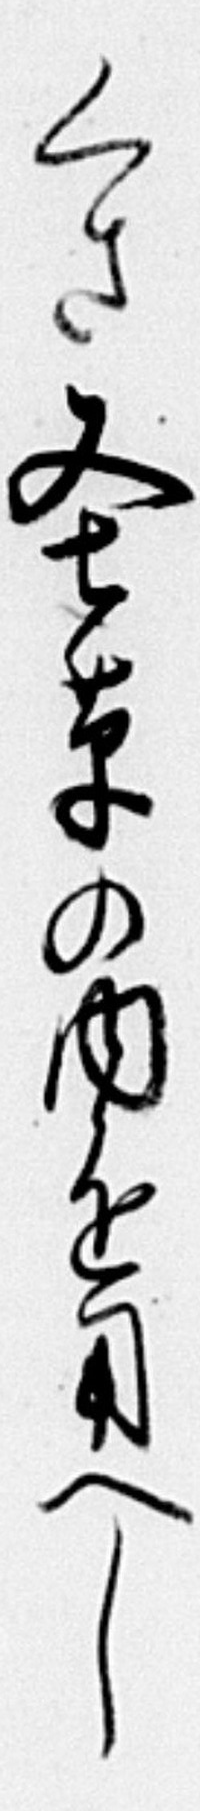くさ又七草の内を用へし
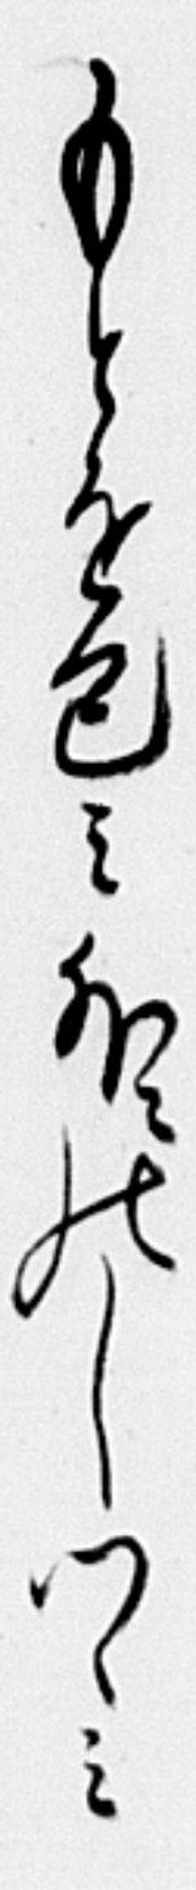もとを包み外にのしつゝみ
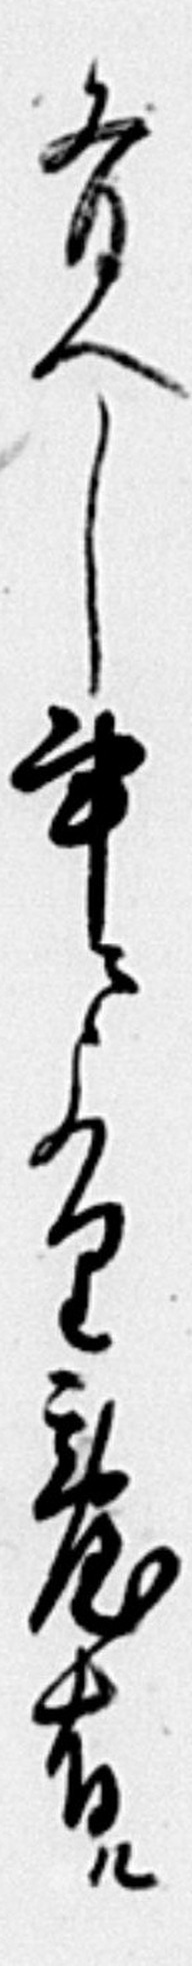有へし事により台有る
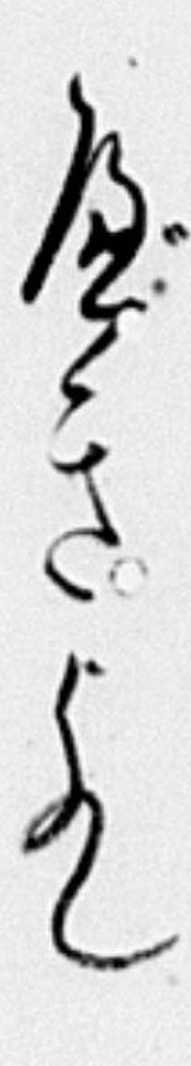へきよし
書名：天児之書（あまがつのしょ）
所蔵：徳島県立図書館
